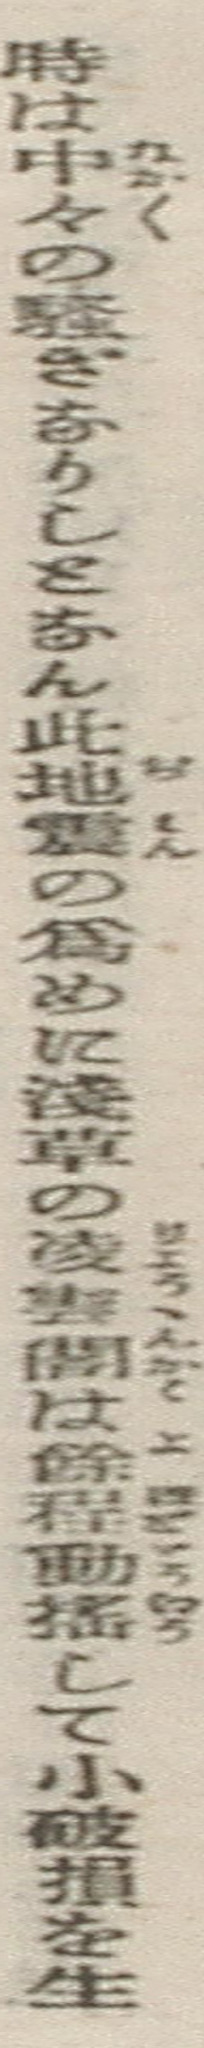時は中々の騒ぎなりしとなん此地震の為めに浅草の凌雲閣は餘程動揺して小破損を生
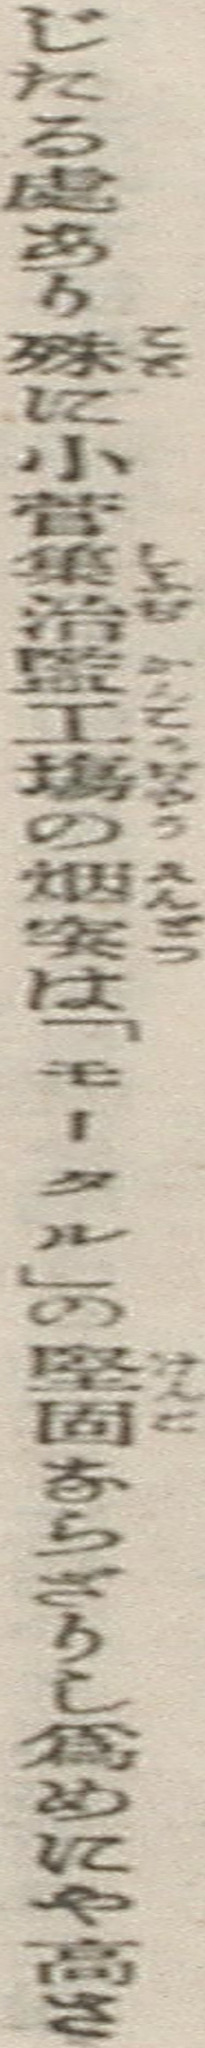じたる處あり殊に小菅集治鑑工場の烟突は「モータル」の堅固ならざりし為めにや高さ
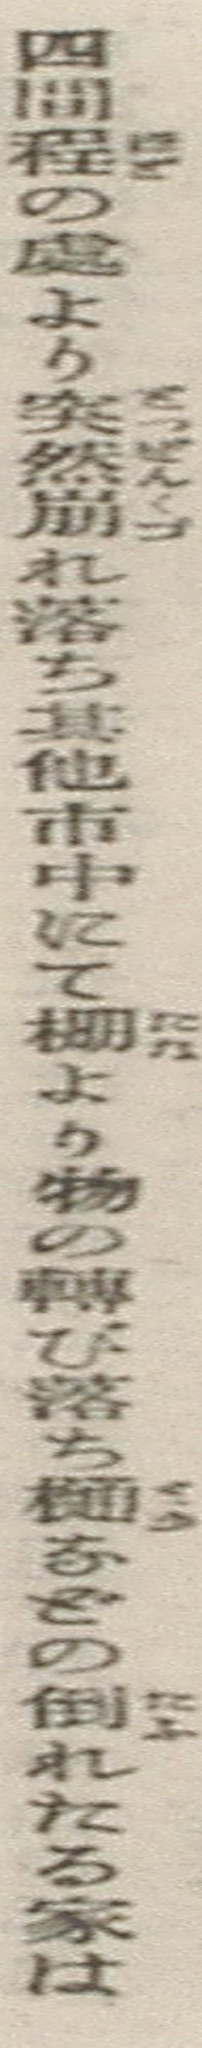四間程の處より突然崩れ落ち其他市中にて棚より物の轉び落ち樋などの倒れたる家は
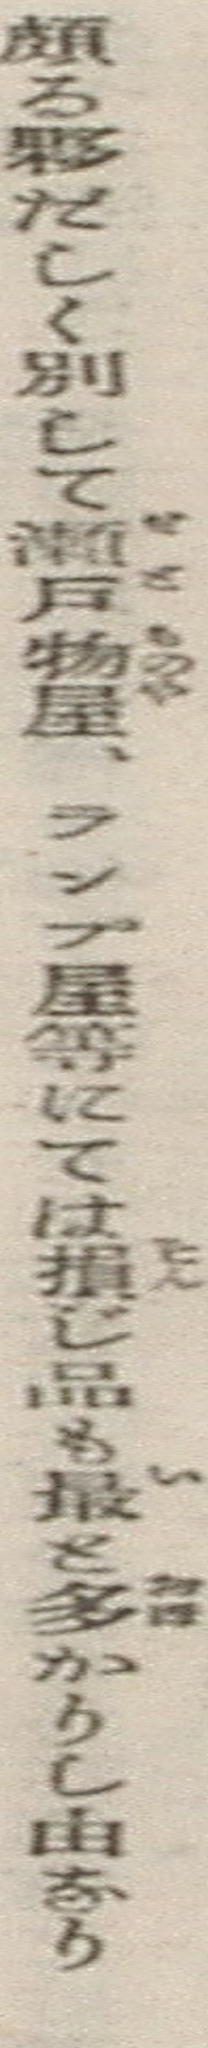頗る夥だしく別して瀬戸物屋、ランプ屋等にては損じ品も最と多かりし由なり
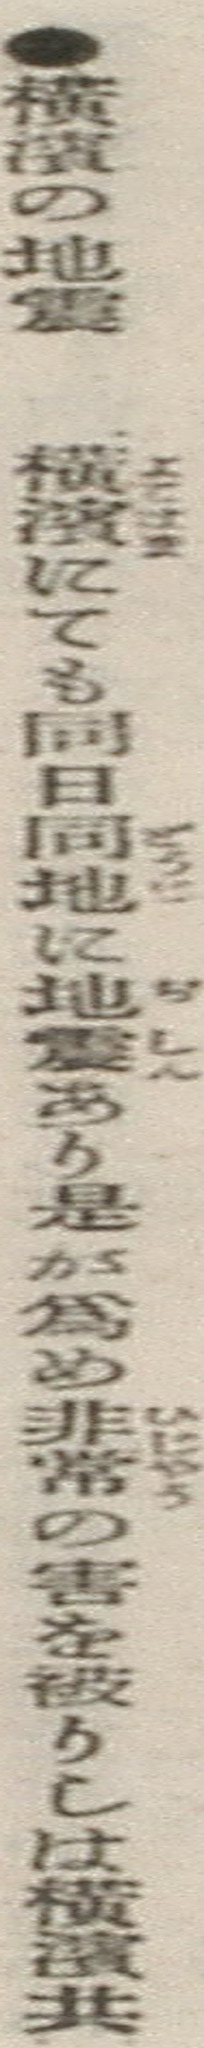●横浜の地震横浜にても同日同地に地震あり是が為め非常の害を被りしは横浜共
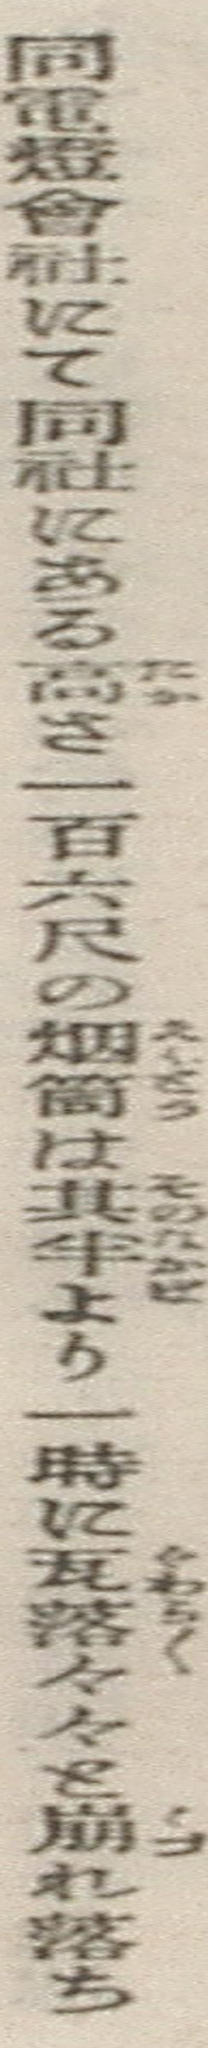同電燈會社にて同社にある高さ一百六尺の烟筒は其半より一時に瓦落々々と崩れ落ち
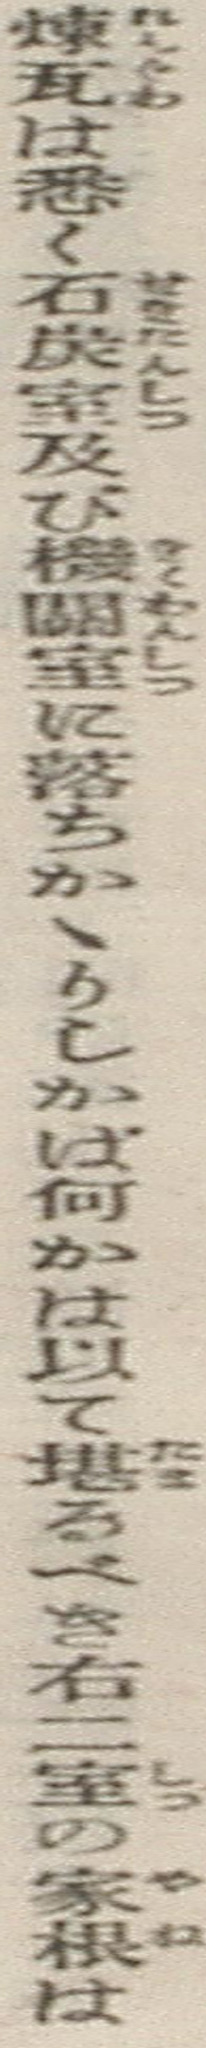煉瓦は悉く石炭室及び機関室に落ちかゝりしかば何かは以て堪るべき右二室の家根は
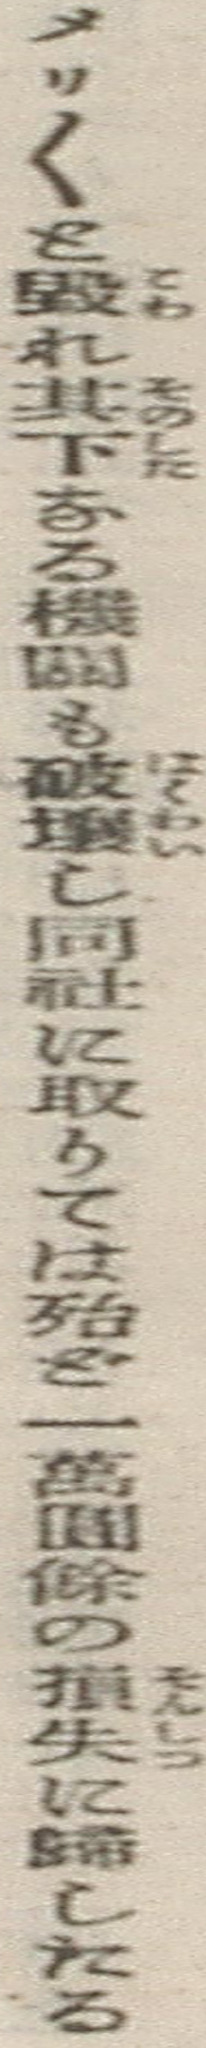メリ〳〵と毀れ其下なる機関も破壊し同社に取りてハ殆ど一萬圓餘の損失に歸したる
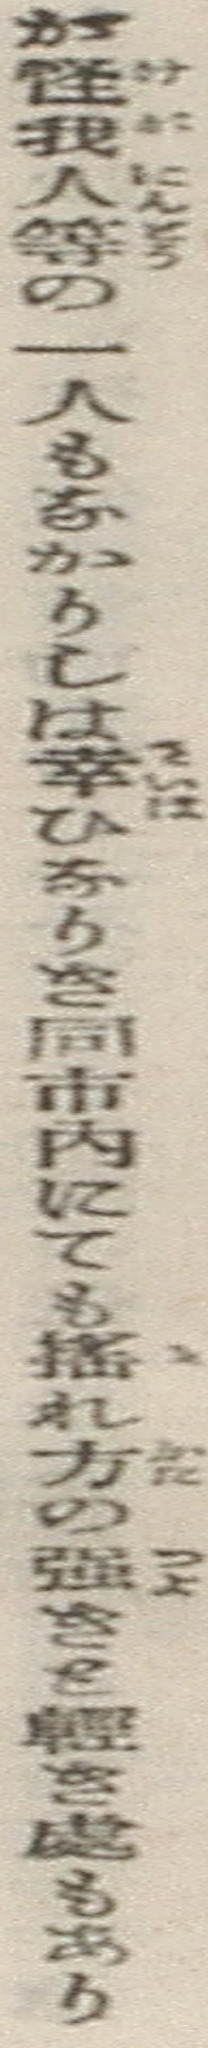が怪我人等の一人もなかりしは幸ひなりき同市内にても揺れ方の強きと輕き處もあり
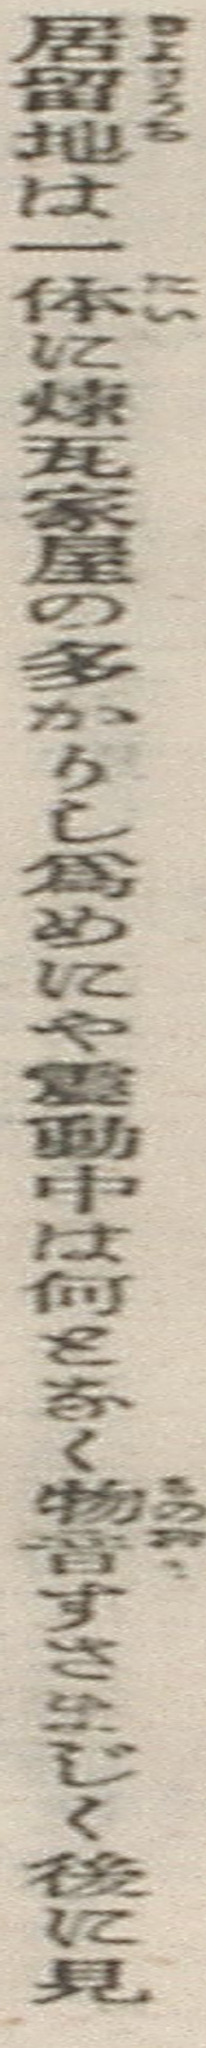居留地は一体に煉瓦家屋の多かりし為めにや震動中は何となく物音すさまじく後に見
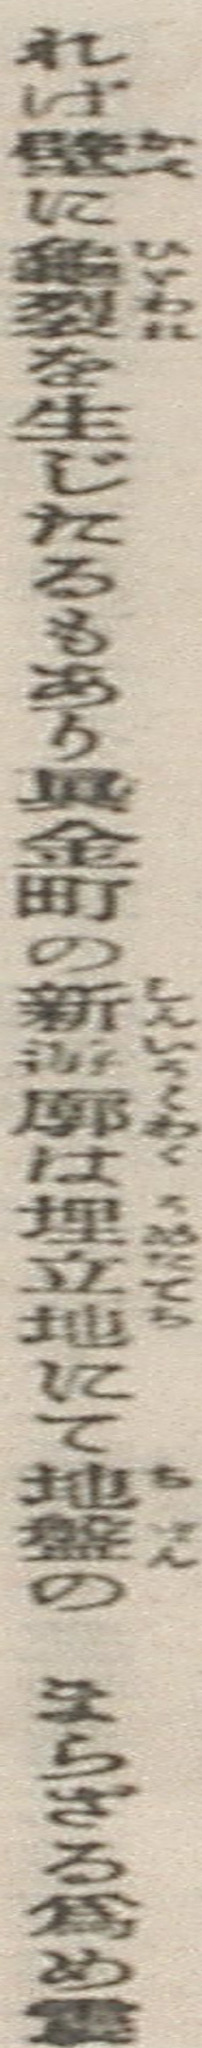れば壁に亀裂を生じたるもあり真金町の震遊廓は埋立地にて地盤のまらざる為め震
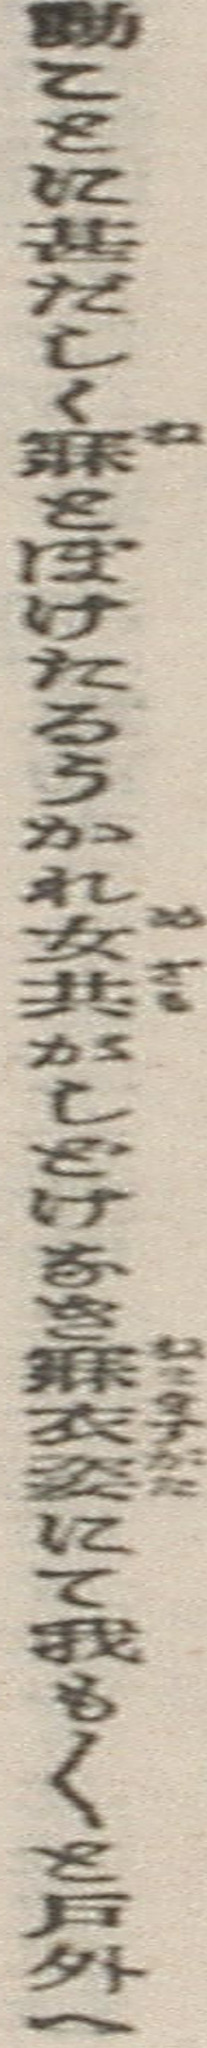動ことに甚だしく寝とぼけたるうかれ女共がしどけなき寝衣姿にて我も〳〵と戸外へ
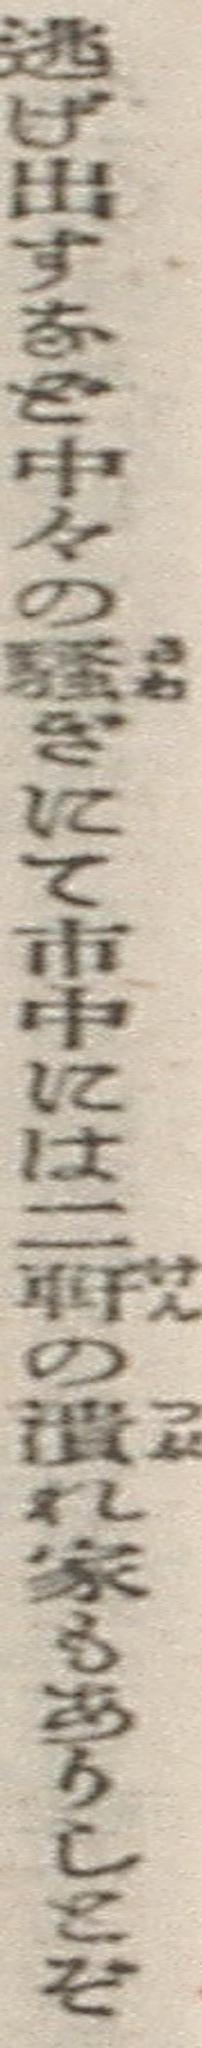逃げ出すなど中々の騒ぎには市中には二軒の潰れ家もありしとぞ
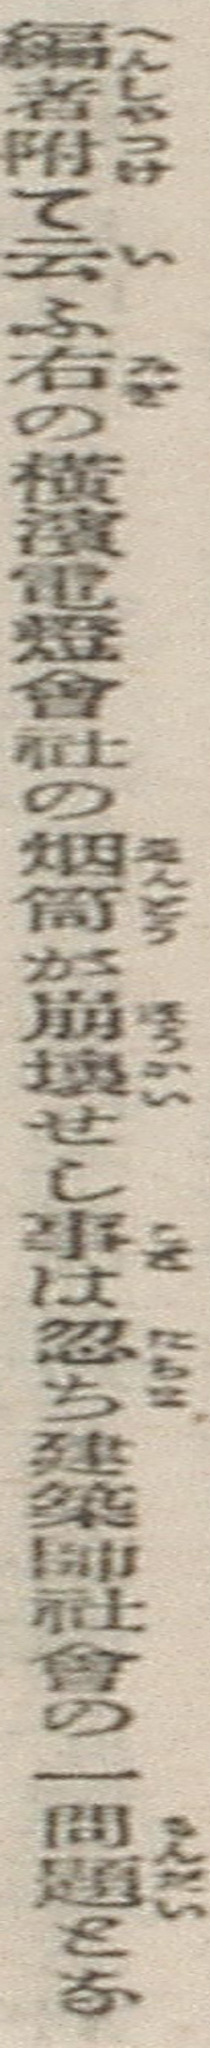編者附て云ふ右の横浜電燈會社の烟筒が崩壊せし事は忽ち建築師社會の一問題とな
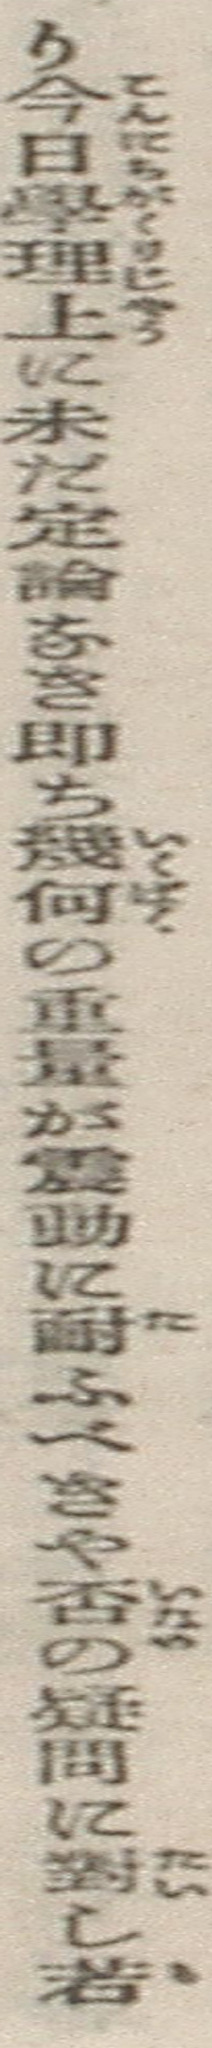り今日學理上に未だ定論なき即ち幾何の重量が振動に耐ふべきや否の疑問に對し若
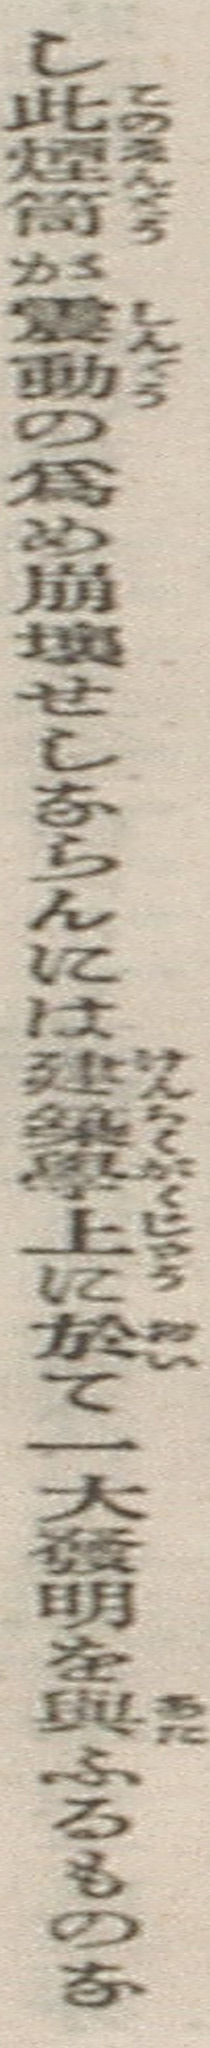し此煙筒が振動の為め崩壊せしならんには建築學上に於て一大發明を與ふるものな
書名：愛知岐阜福井三県　大地震見聞録（内題）
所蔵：東京大学地震研究所図書室 Earthquake Research Institute Library, The University of Tokyo, JAPAN
